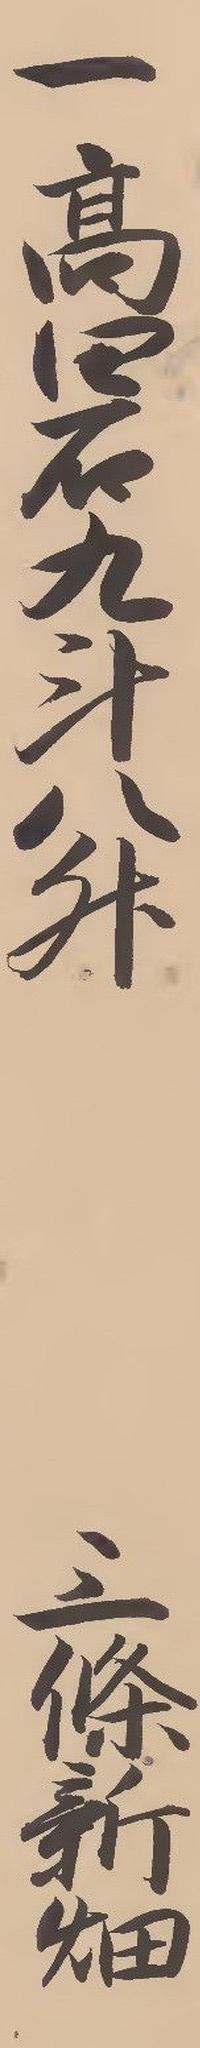一高四石九斗八升三条新畑
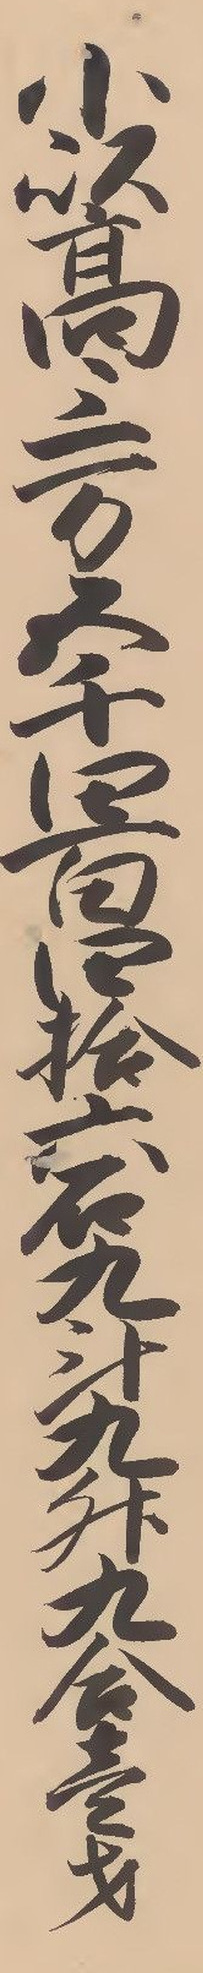小以高三万五千四百四拾六石九斗九升九合壱才

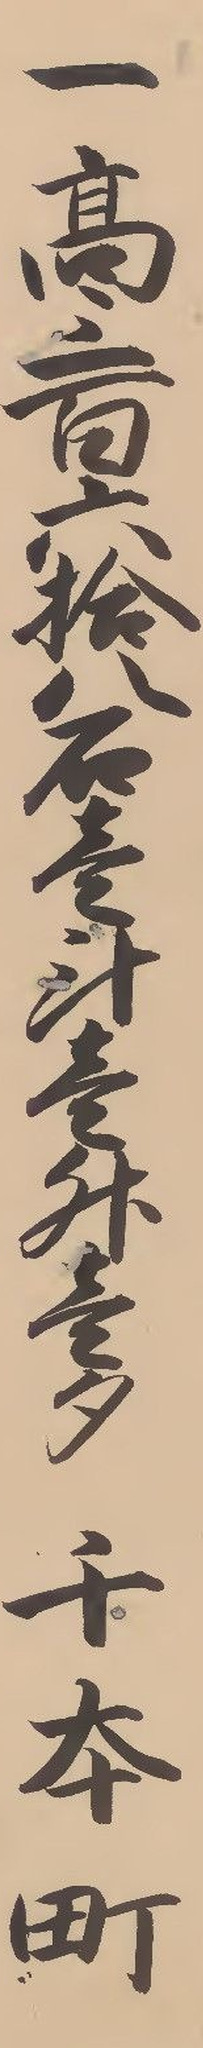一高三百六拾八石壱斗壱升壱勺千本町
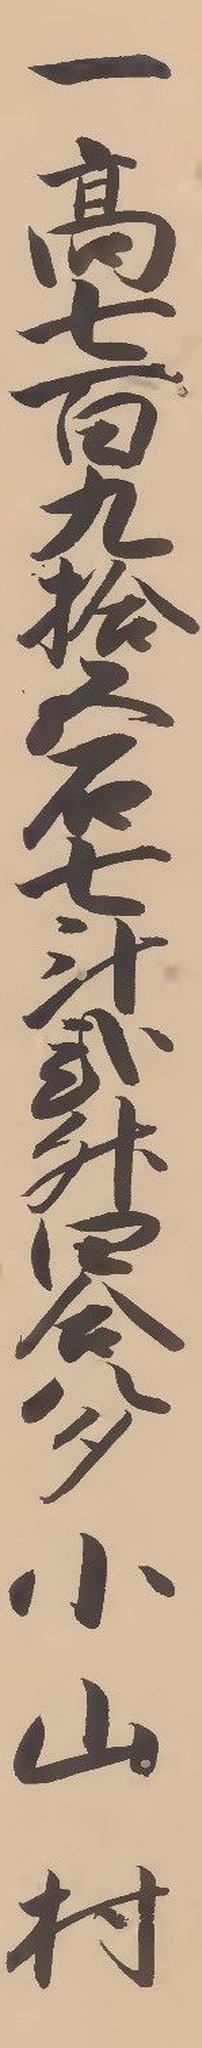一高七百九拾五石七斗弐升四合ハ勺小山村
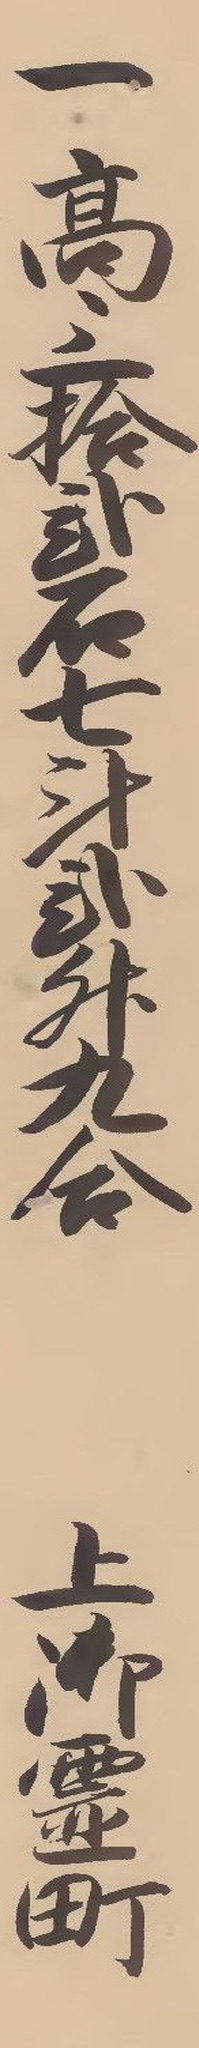一高三拾弐石七斗弐升九合上御霊町

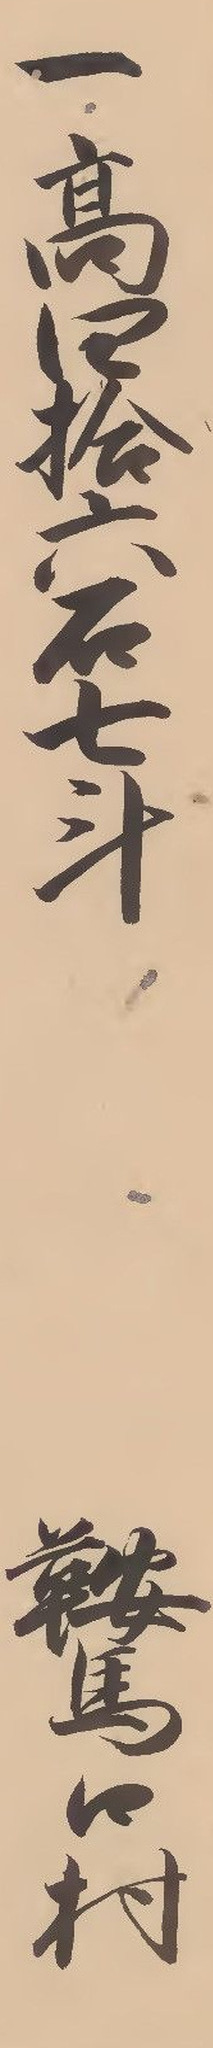一高四拾六石七斗鞍馬口村
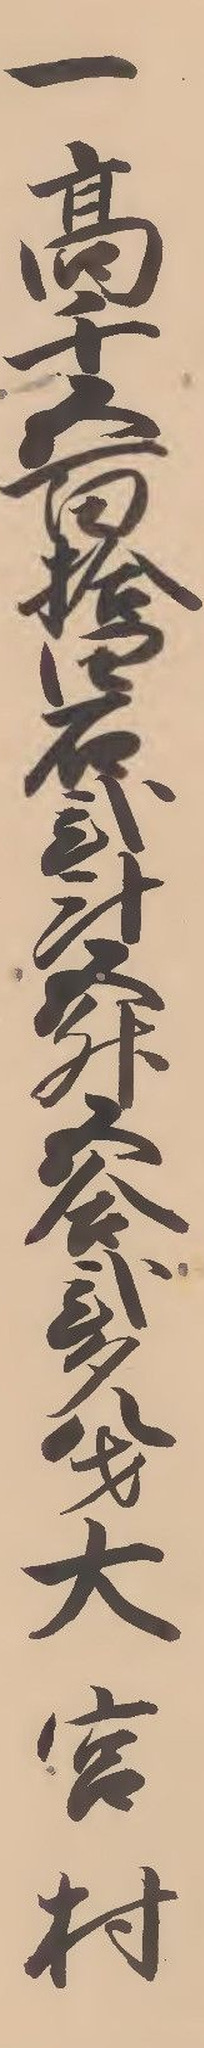一高千五百拾四石弐斗五升五合弐勺八才大宮村
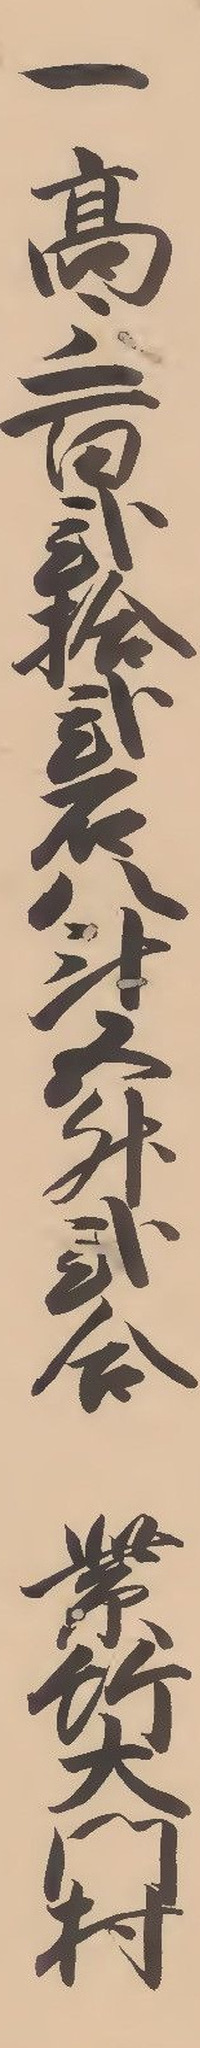一高三百弐拾弐石八斗五升弐合紫竹大門村
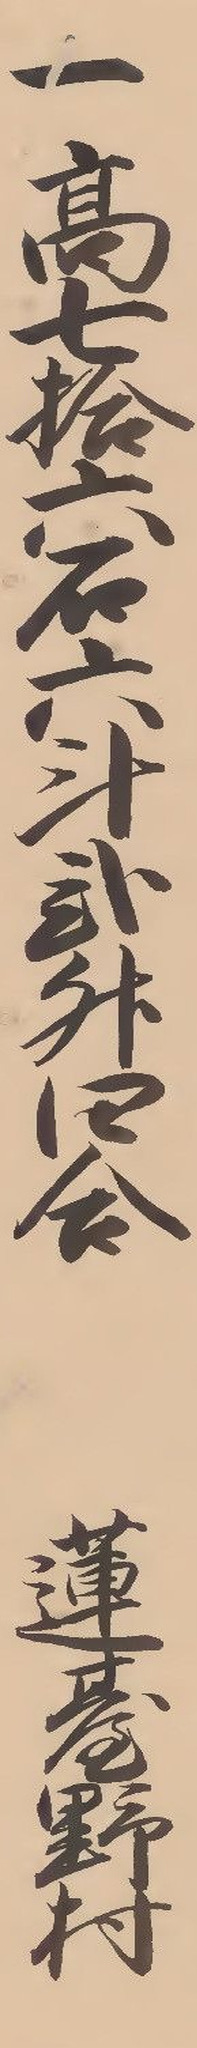一高七拾六石六斗弐升四合蓮台野村
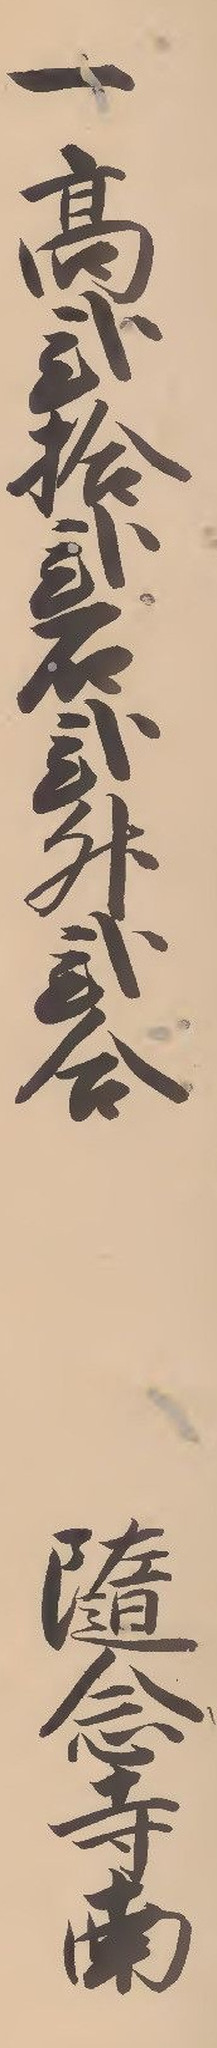一高弐拾弐石弐升弐合随念寺南
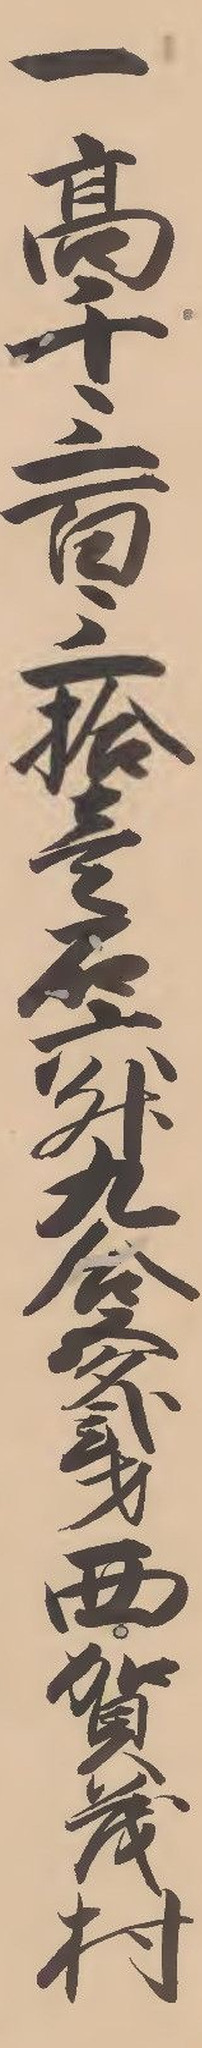一高千三百三拾壱石六斗九合五勺弐才西賀茂村
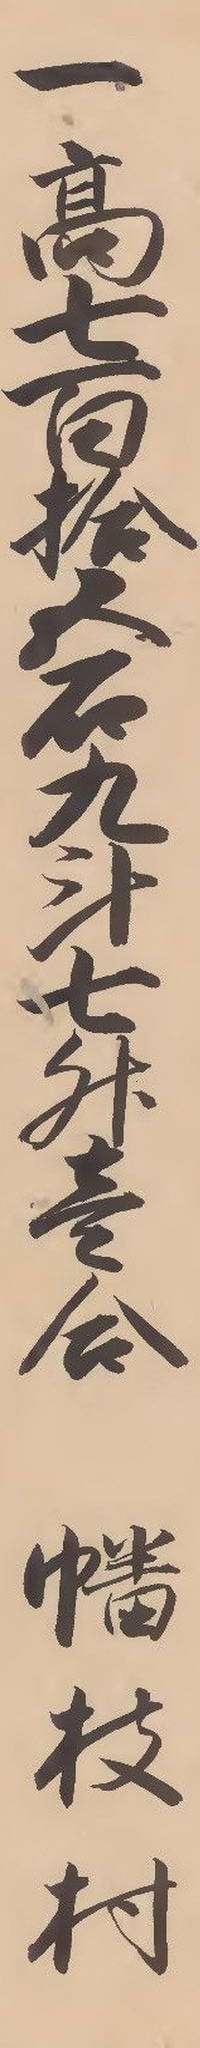一高七百拾五石九斗七升壱合幡枝村

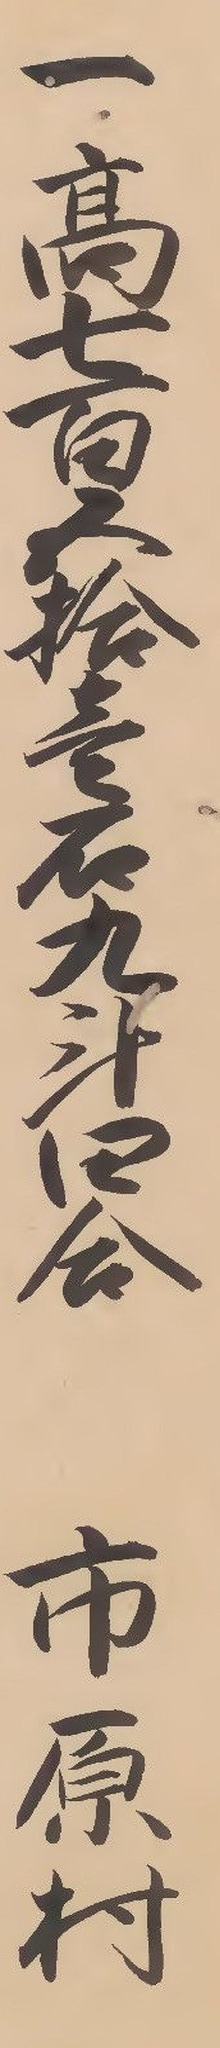一高七百五拾壱石九斗四合市原村
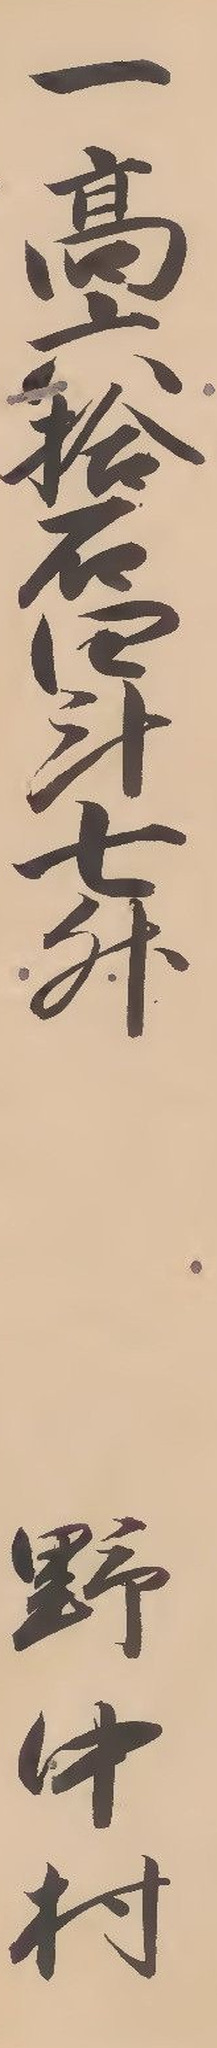一高六拾石四斗七升野中村
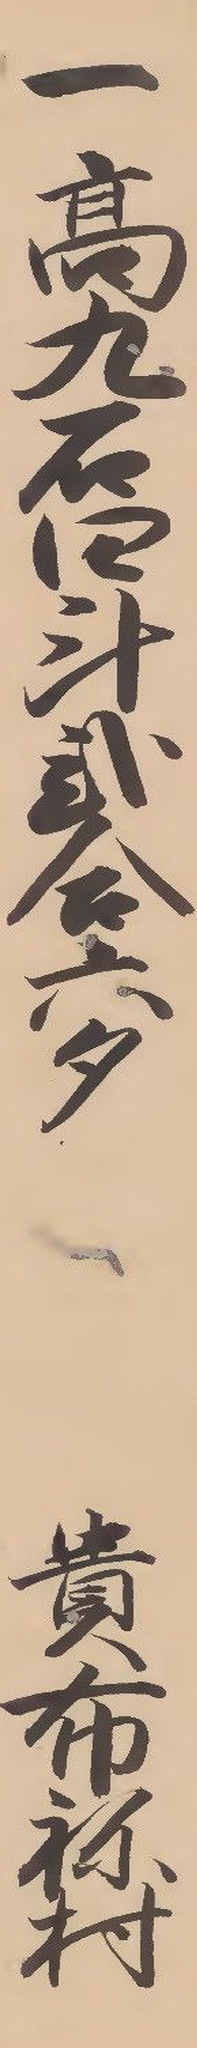一高九石四斗弐合六勺貴布祢村
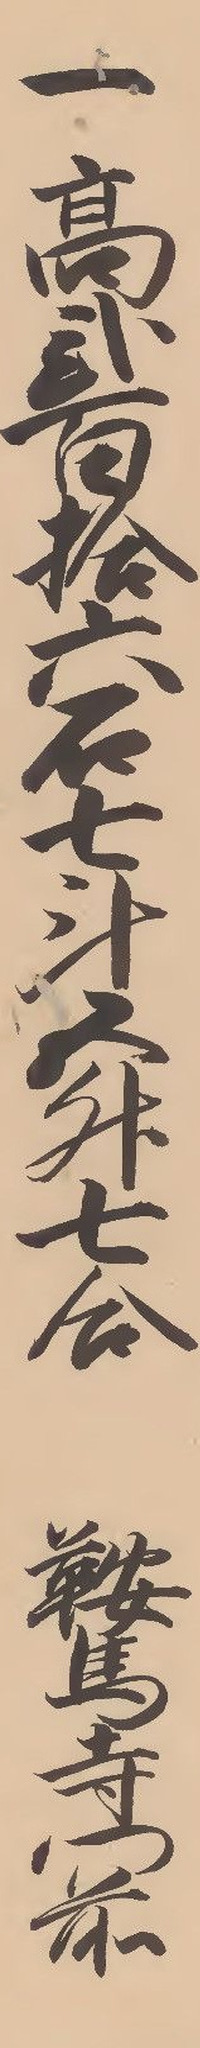一高弐百拾六石七斗五升七合鞍馬寺門前
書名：山城国郷帳
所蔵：国立公文書館 National Archives of Japan
